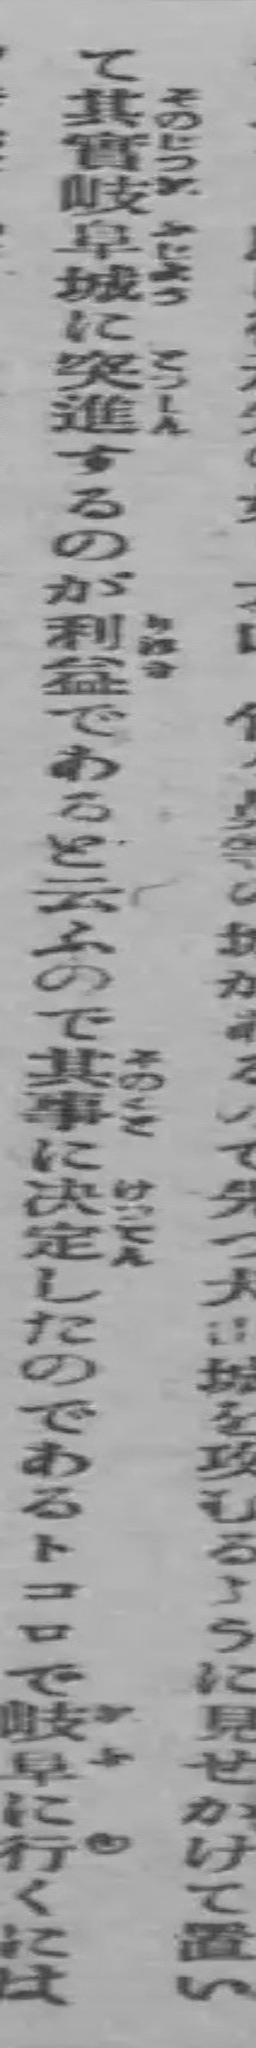て其実岐阜城に突進するのが利益であると云ふので其事に決定したのであるトコロで岐阜に行くには
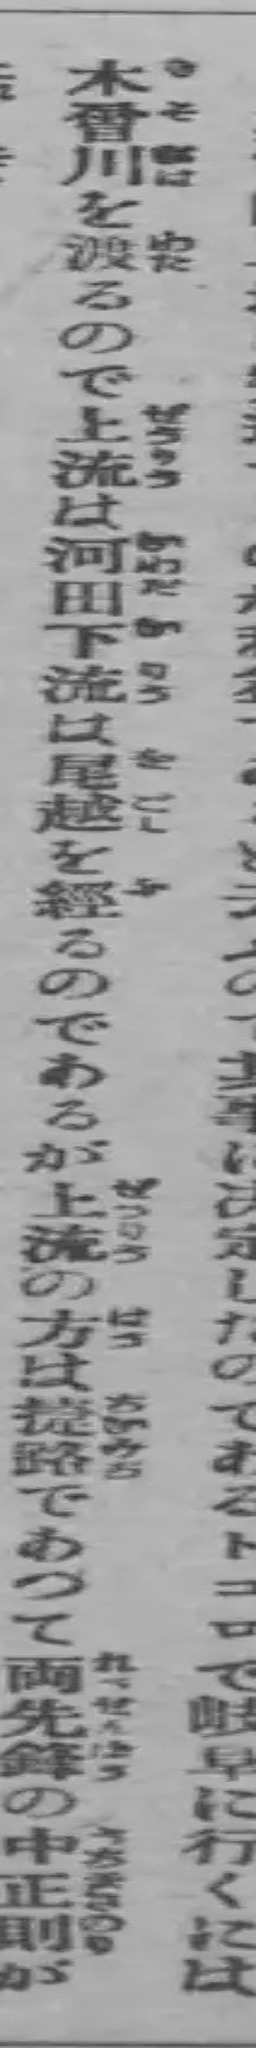木曽川を渡るので上流は河田下流は尾越を経るのであるが上流の方は捷路であつて両先鋒の中正則が
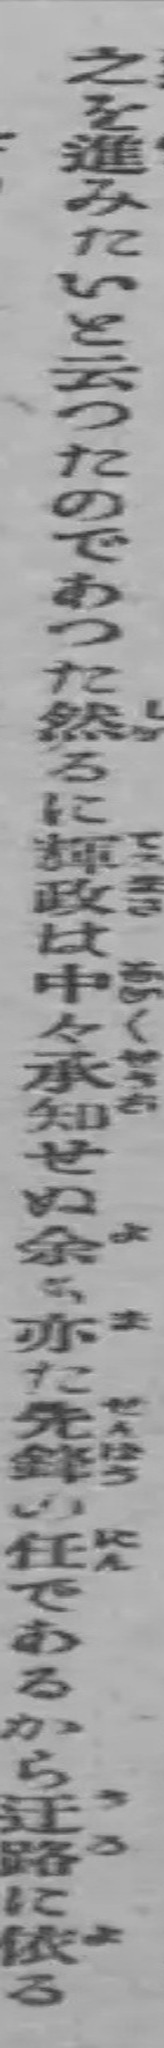之を進みたいと云つたのであつた然るに輝政は中々承知せぬ余も亦た先鋒の任であるから迂路に依る
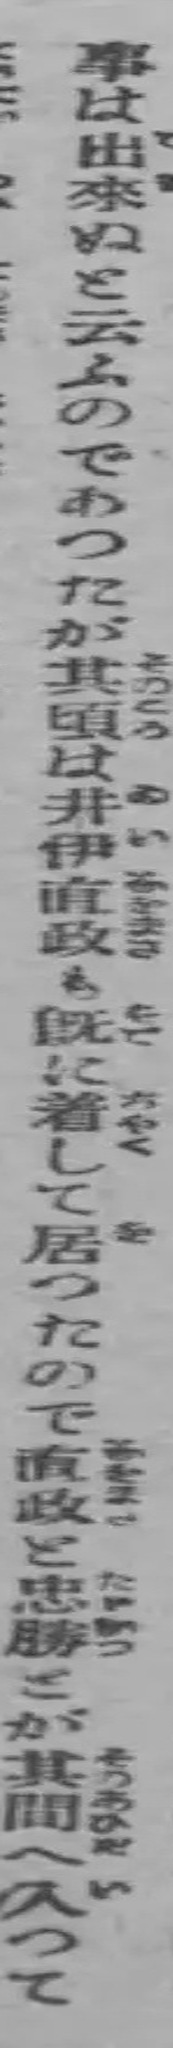事は出来ぬと云ふのであつたが其頃は井伊直正も既に着して居つたので直正と忠勝とが其間へ入つて
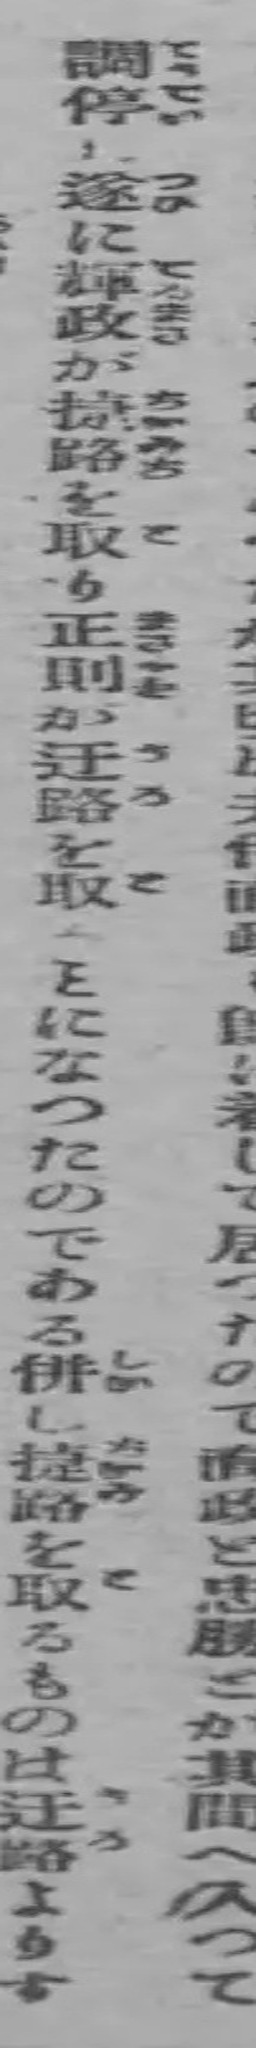調停し遂に輝政が捷路を取り正則が迂路を取ることになつたのである併し捷路を取るものは迂路よりす
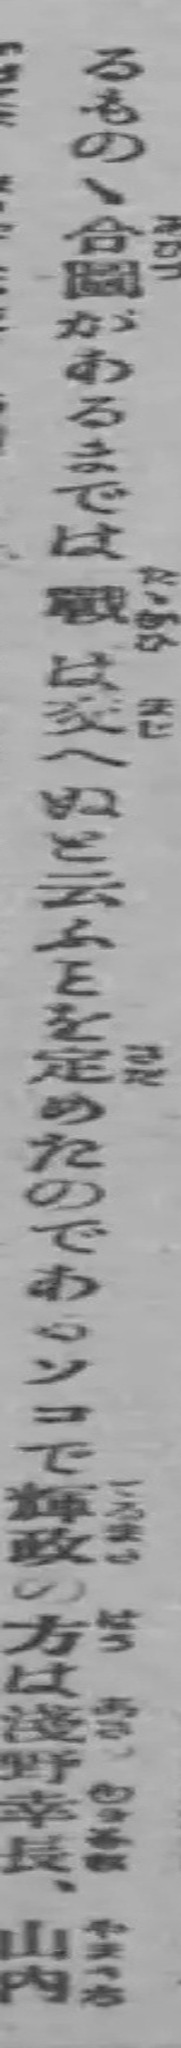輝政の戦功るものゝ合図があるまでは戦は交へぬと云ふことを定めたのであるソコで輝政の方は浅野幸長、山内
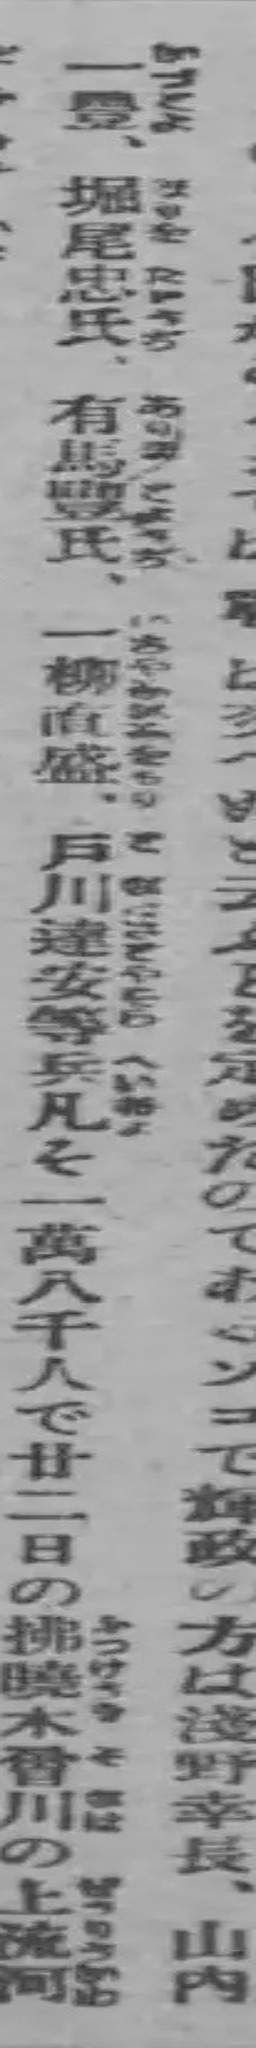一豊、堀尾忠氏、有馬豊氏、一柳直盛、戸川達安等兵凡そ一万八千人で廿二日の払暁木曽川の上流河
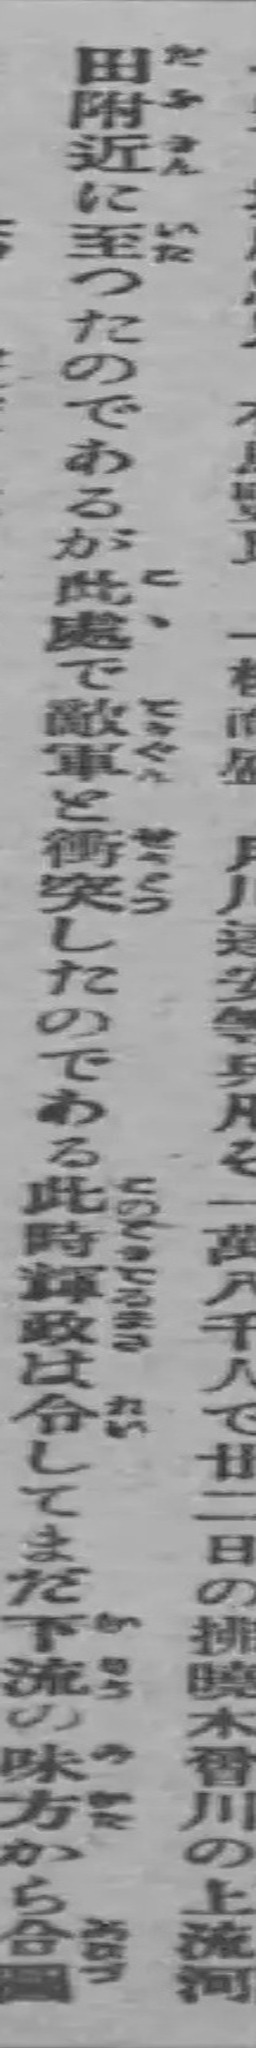田附近に至つたのであるが此処で敵軍と衝突したのである此時輝政は令してまだ下流の味方から合図
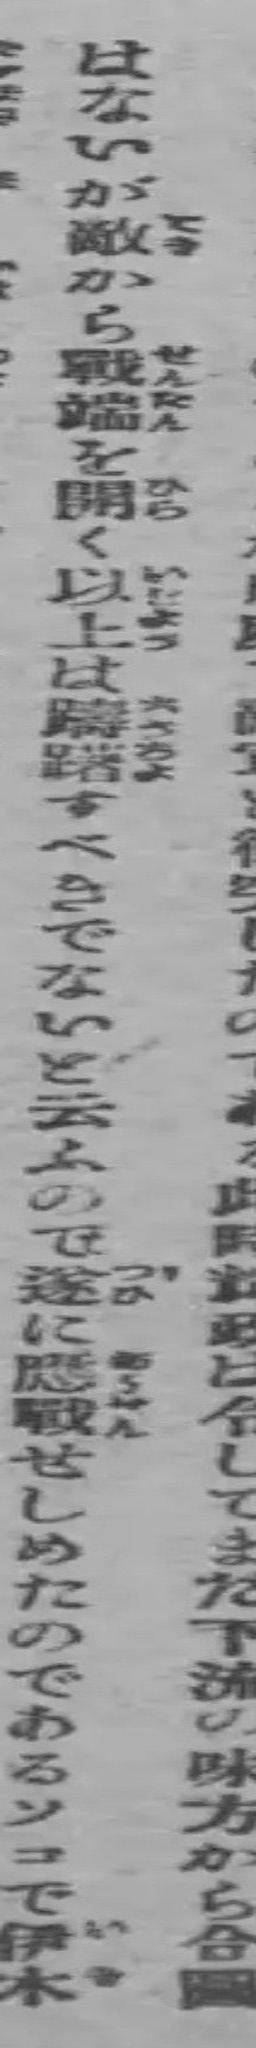はないが敵から戦端を開く以上は躊躇すべきでないと云ふので遂に応戦せしめたのであるソコで伊木
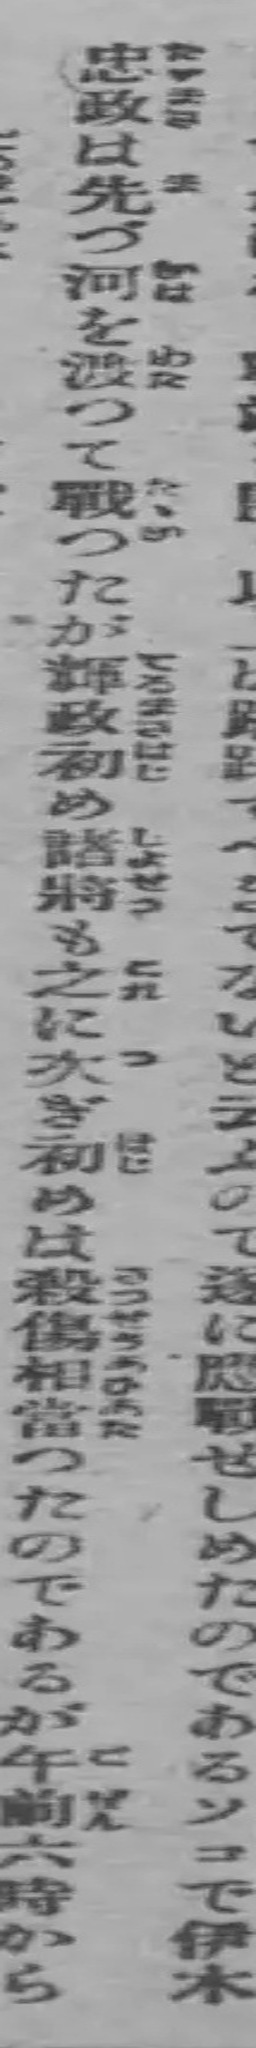忠政は先づ河を渡つて戦つたが輝政初め諸将も之に次ぎ初めは殺傷相当つたのであるが午前六時から
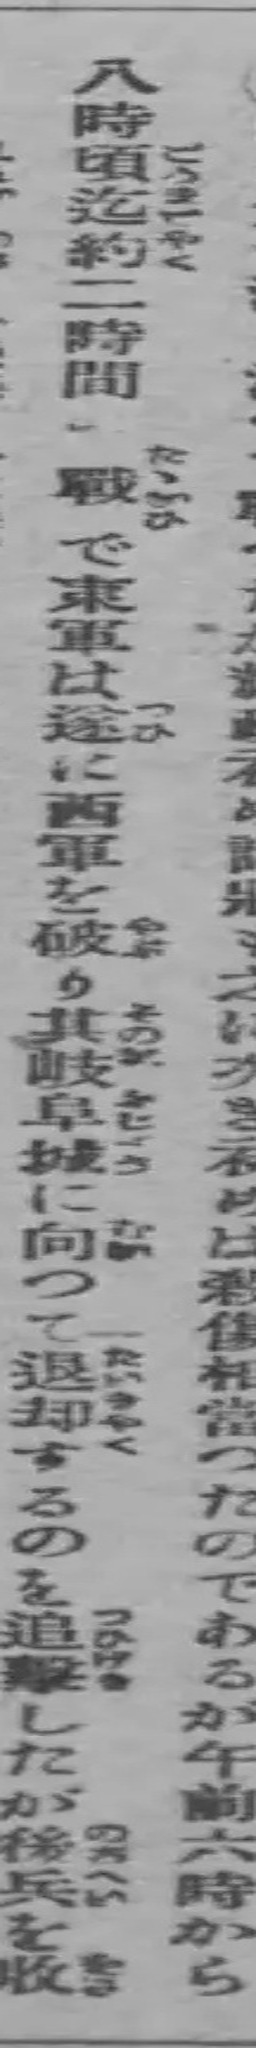八時頃迄約二時間の戦で東軍は遂に西軍を破り其岐阜城に向つて退却するのを追撃したが後兵を収
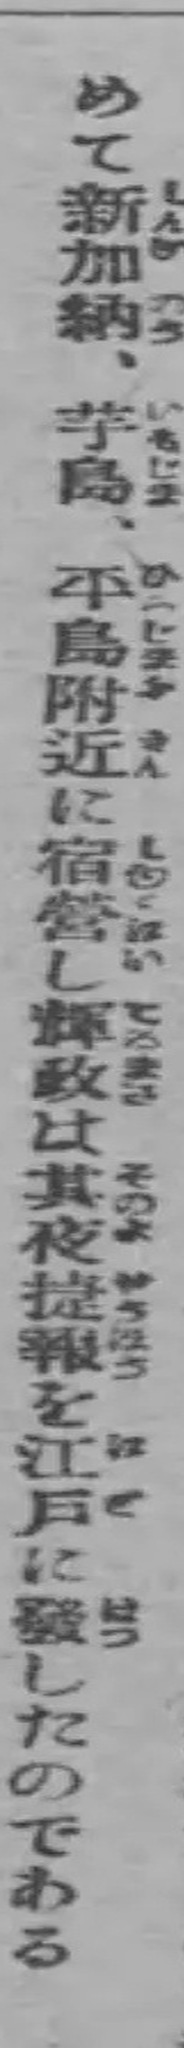めて新加納、芋島、平島附近に宿営し輝政は其夜捷報を江戸に発したのである
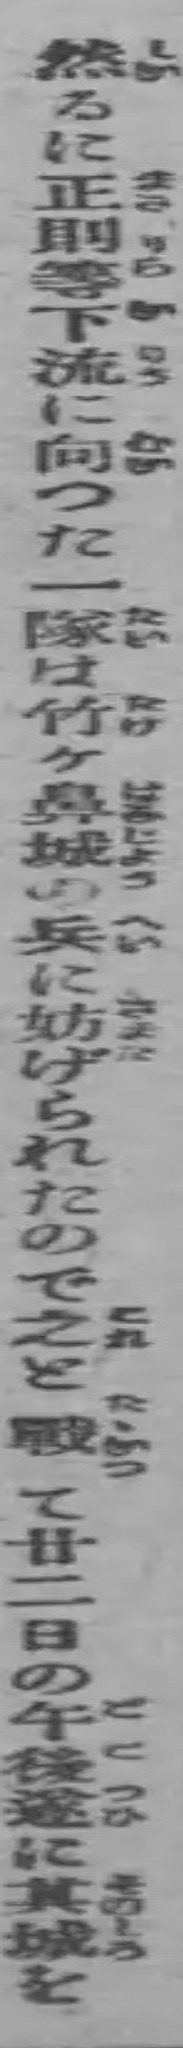然るに正則等下流に向つた一隊は竹ケ鼻城の兵に妨げられたので之と戦て廿二日の午後遂に其城を
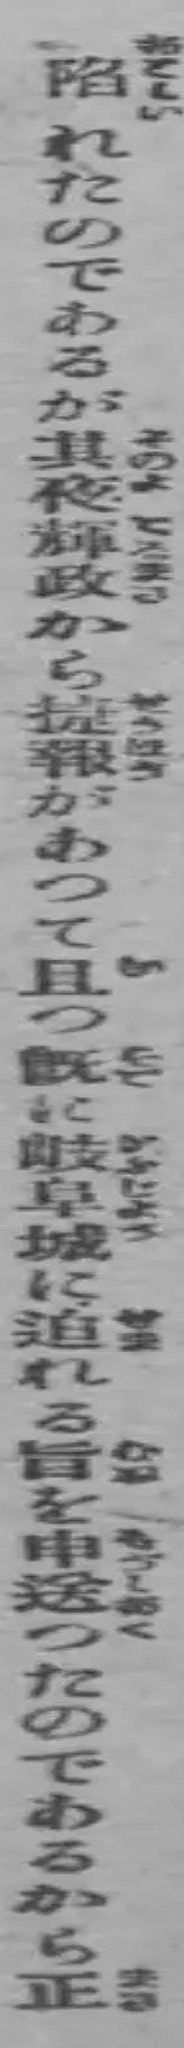陥れたのであるが其夜輝政から捷報があつて且つ既に岐阜城に迫れる旨を申送つたのであるから正
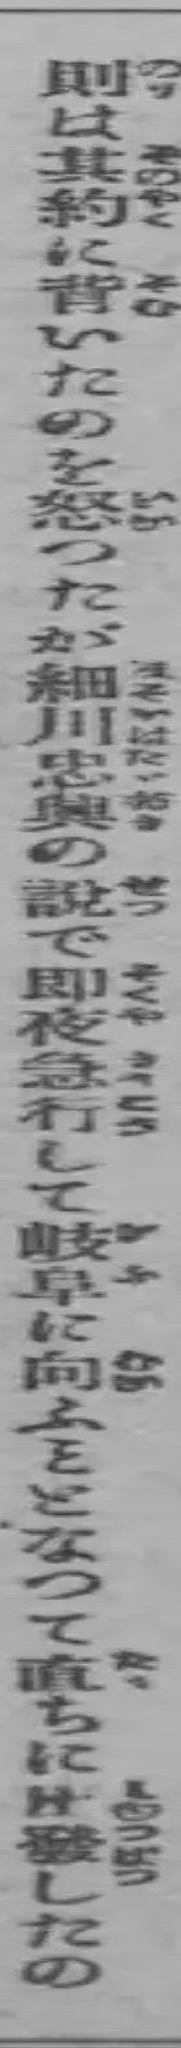則は其約に背いたのを怒つたが細川忠興の説で即夜急行して岐阜に向ふこととなつて直ちに出発したの
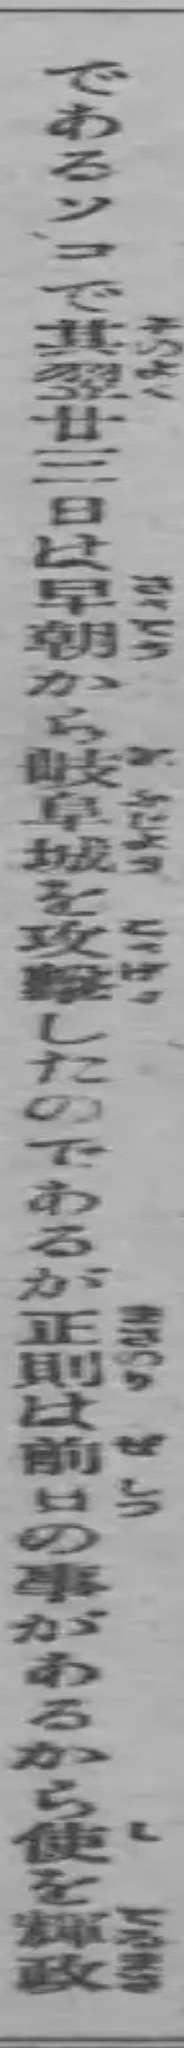であるソコで其翌廿三日は早朝から岐阜城を攻撃したのであるが正則は前日の事があるから使を輝政
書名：豊橋市史談
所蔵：国立国会図書館 National Diet Library, JAPAN
